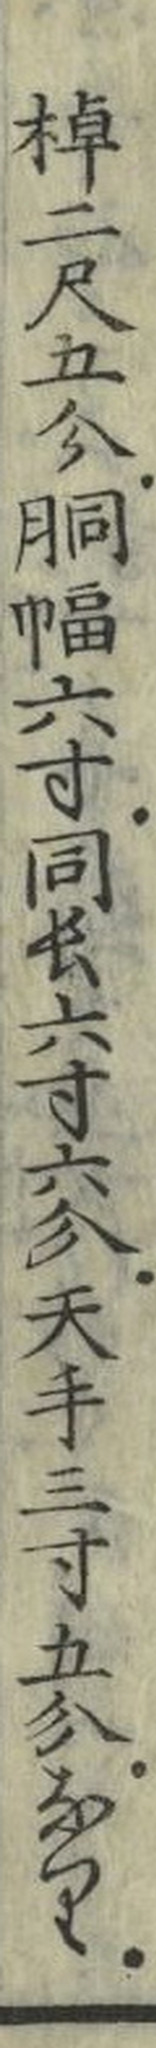棹二尺五分・胴幅六寸・同長六寸六分・天手三寸五分・なり・

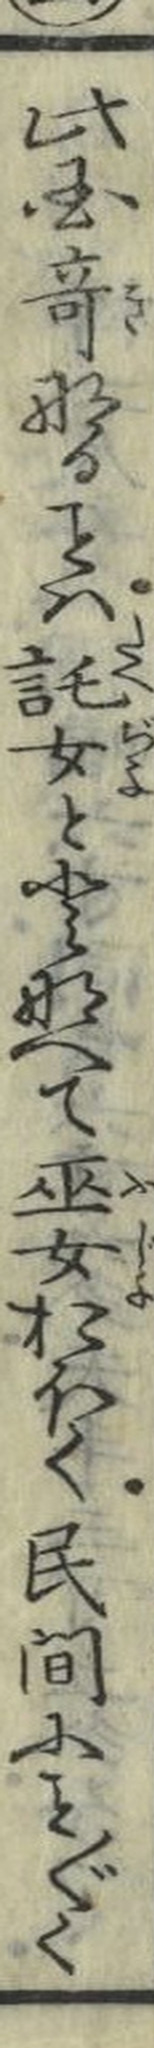此国竒なることは・託女ととなへて巫女おほく・民間にこと〴〵く
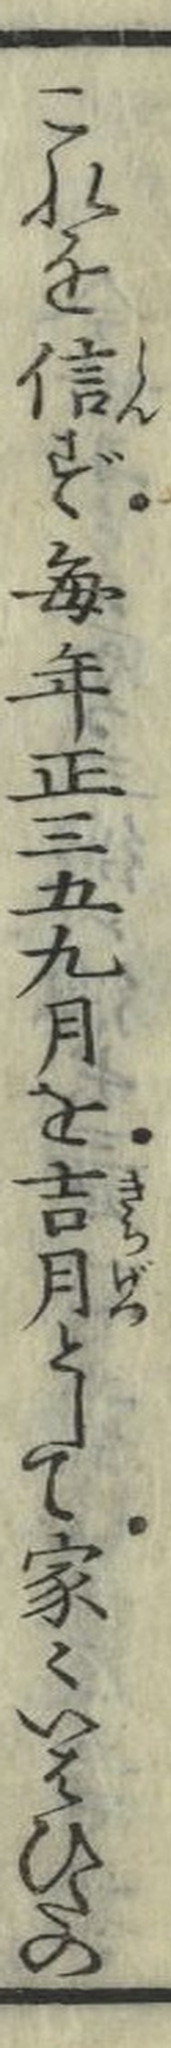これを信ず・毎年正三五九月を・吉月として・家々いはひたの
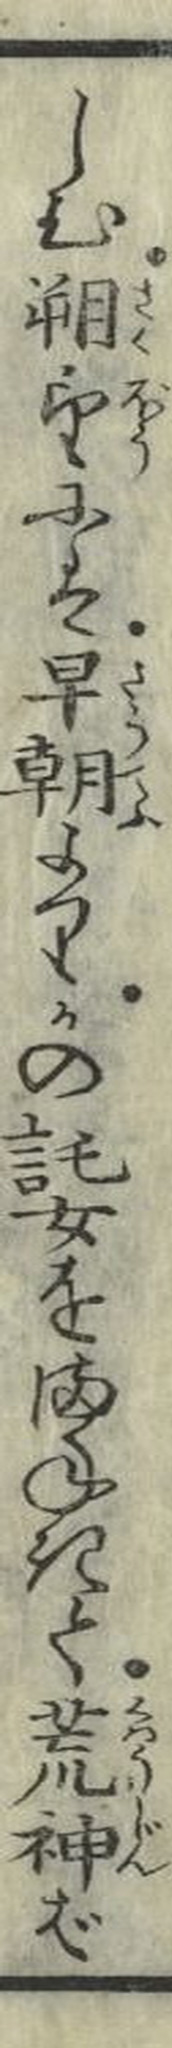しむ・朔望には・早朝より・かの託女をまねきて・荒神ば
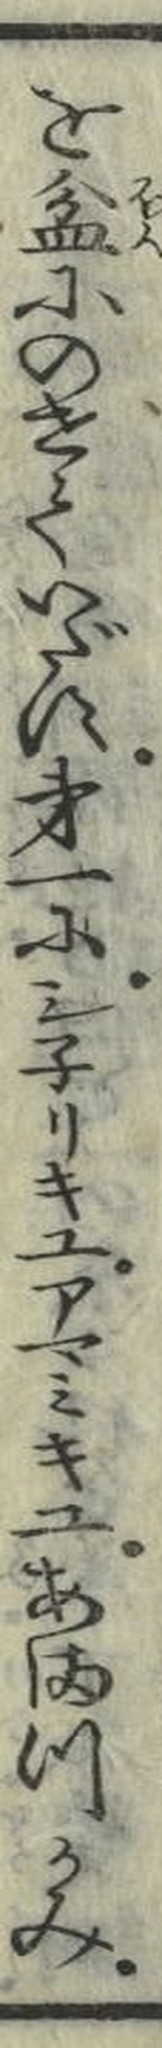を盆にのせていだす・第一に・シネリキユ・アマミキユ・あまつかみ・
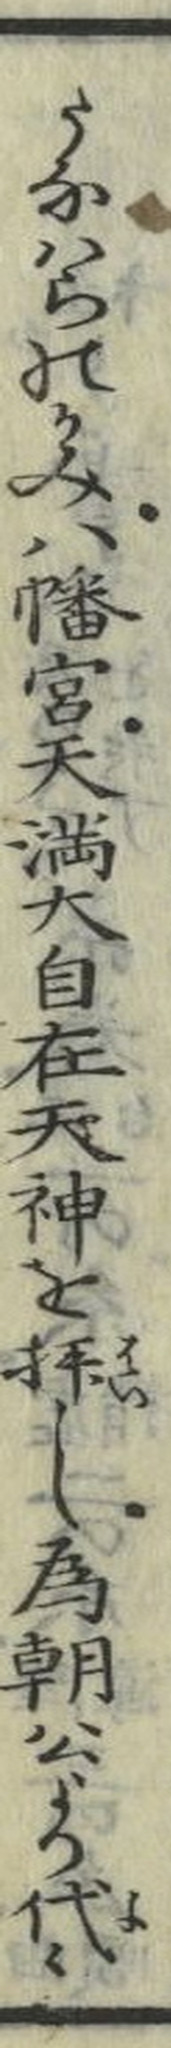うなはらのかみ・八幡宮・天満大自在天神を拝し・爲朝公より代々
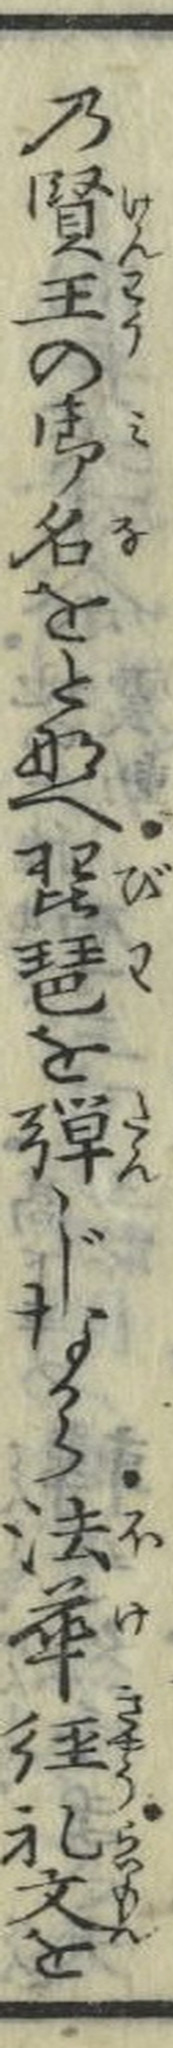の賢王の御名をとなへ・琵琶を弾じなから・法華經・礼文を
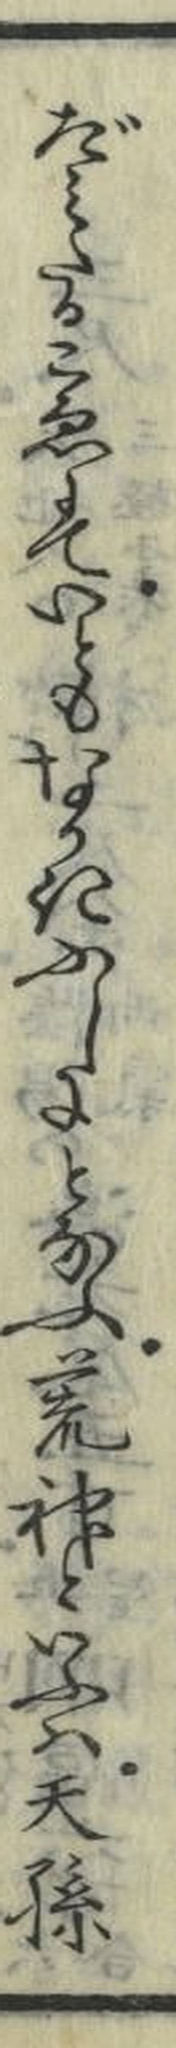だみたるこゑにて・いともなかきふしにとなふ・荒神といふは・天孫
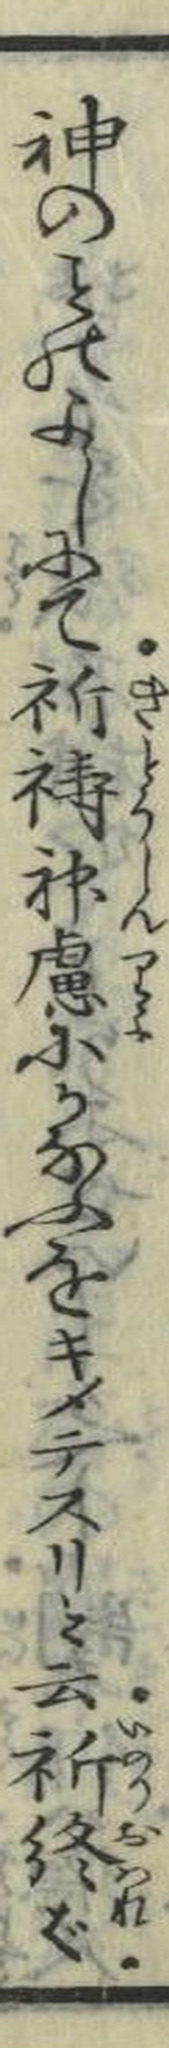神のことのよしにて・祈祷神慮にかなふをキメテスリと云・祈終ば
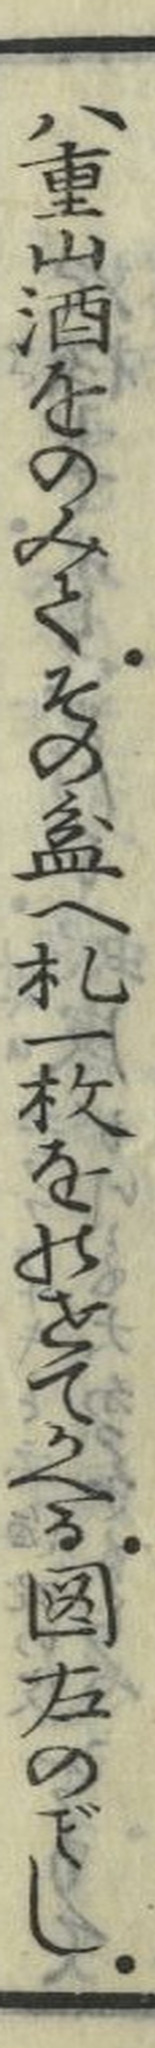八重山酒をのみて・その盆へ札一枚をのせてかへる・図左のごとし・
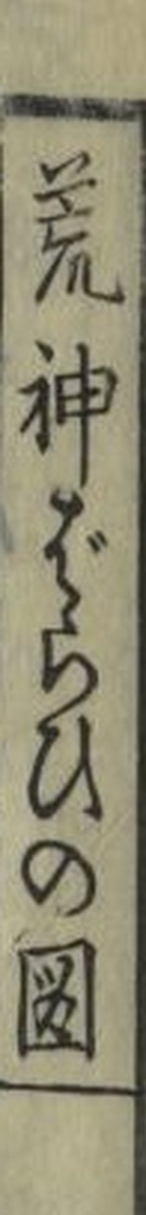荒神ばらいの図

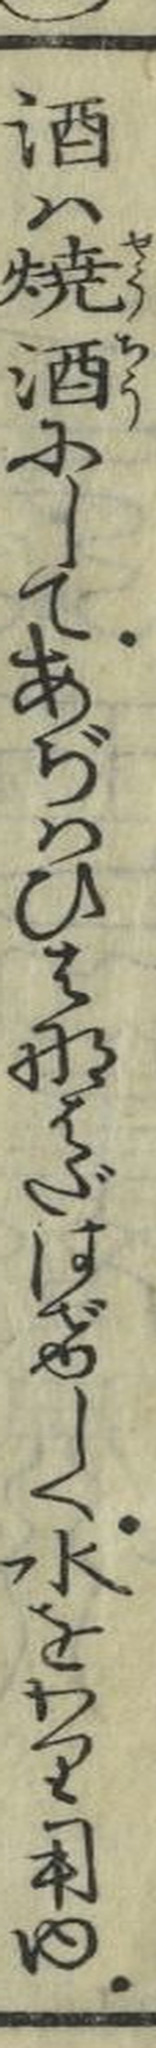酒は焼酒にして・あぢはひはなはだはげしく・水をわり用ゆ・
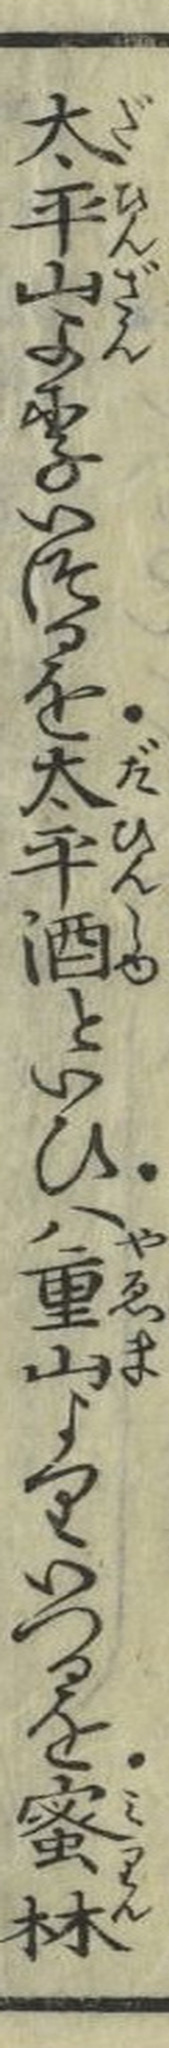太平山よりいつるを・太平酒といひ・八重山よりいつるを・蜜林
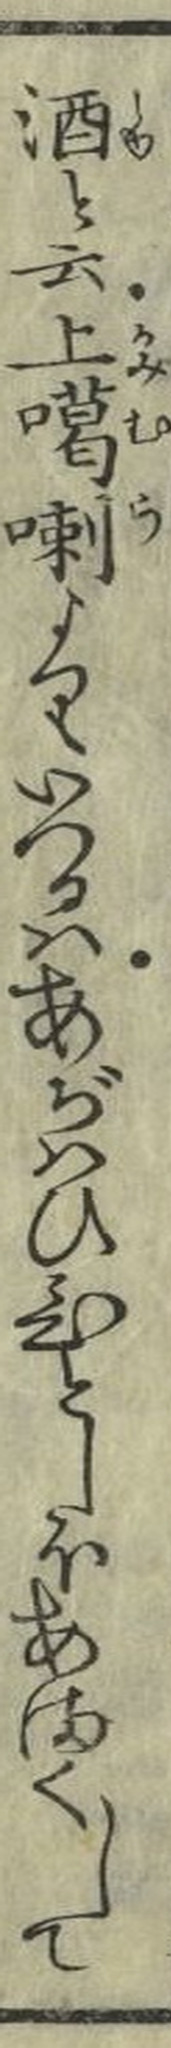酒と云・上噶喇よりいつるは・あぢはひひとしほあまくして
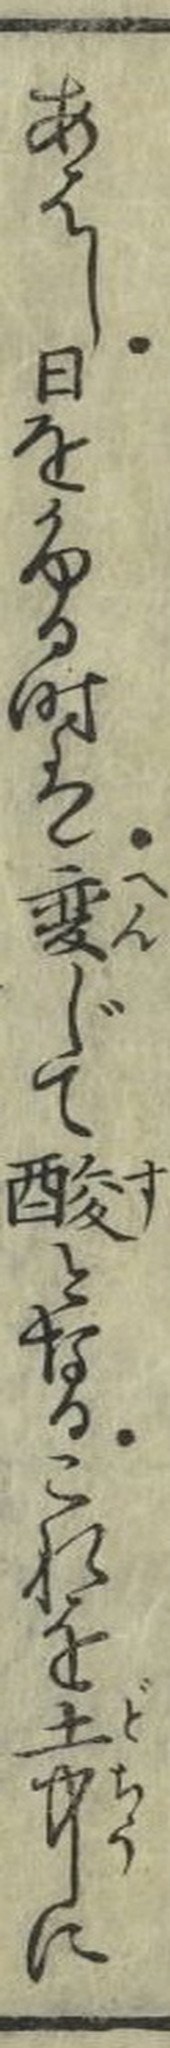あはし・日をける時は・変じて酸となる・これを土中に
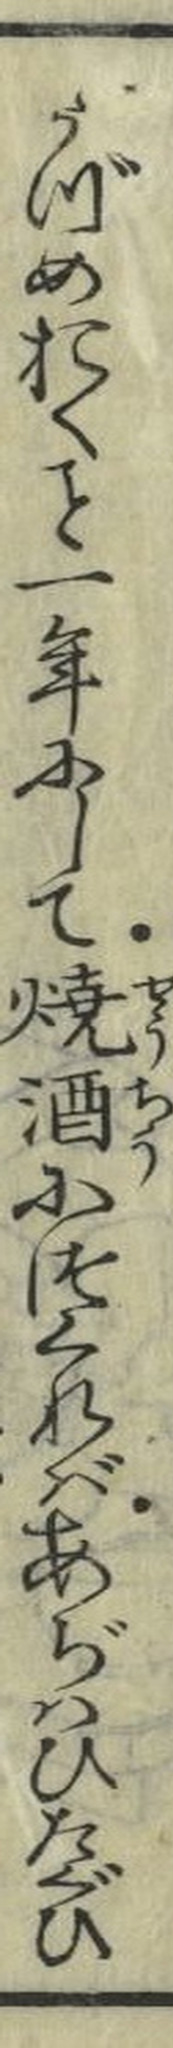うづめおくこと一年にして・焼酒につくれば・あぢはひたぐひ
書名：琉球秊代記 附雑話 全
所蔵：University of the Ryukyus Library
